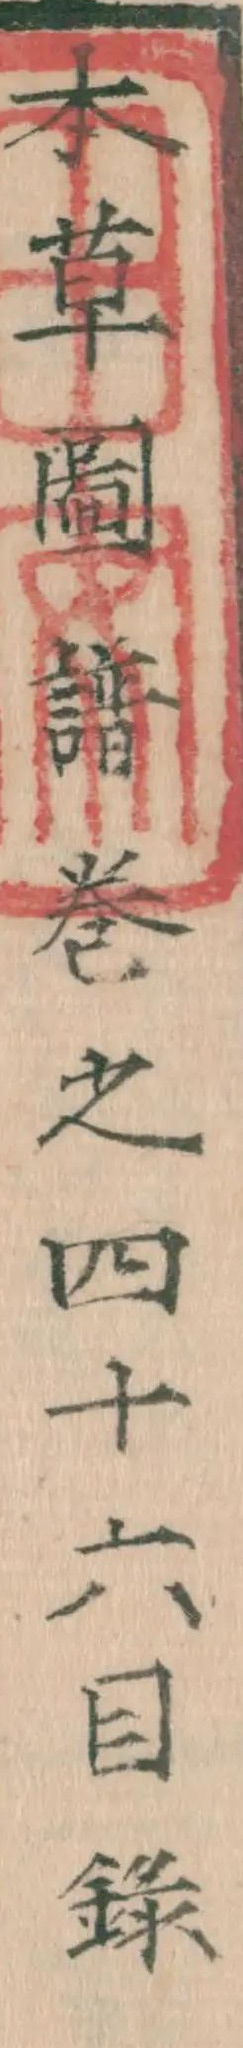本草図譜巻之四十六目録

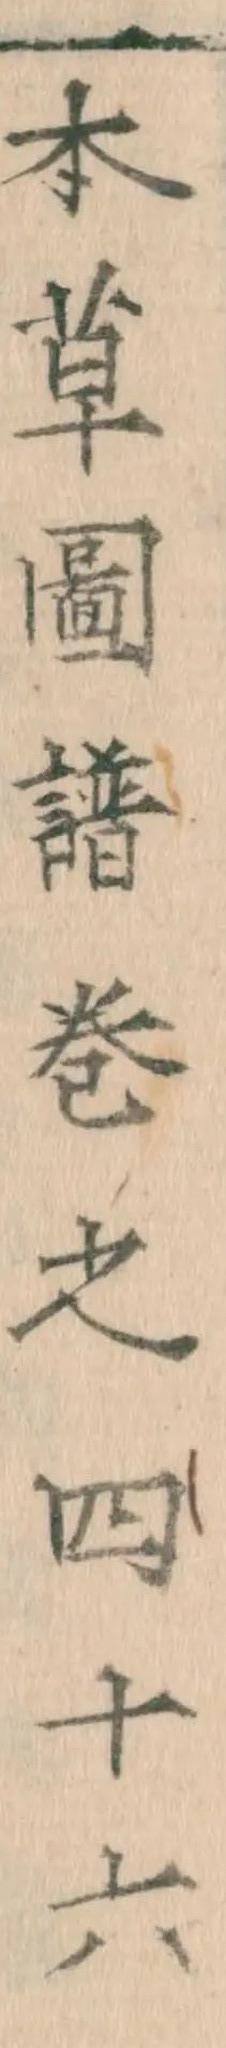本草図譜巻之四十六
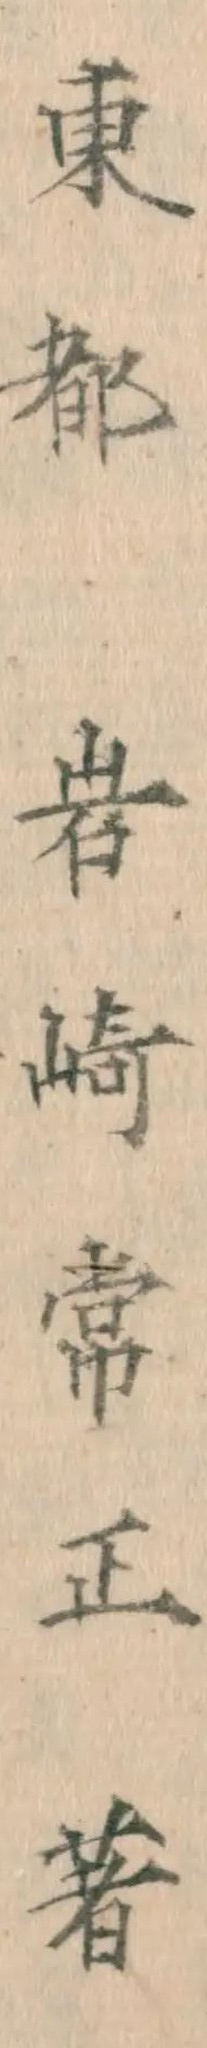東都岩崎常正著

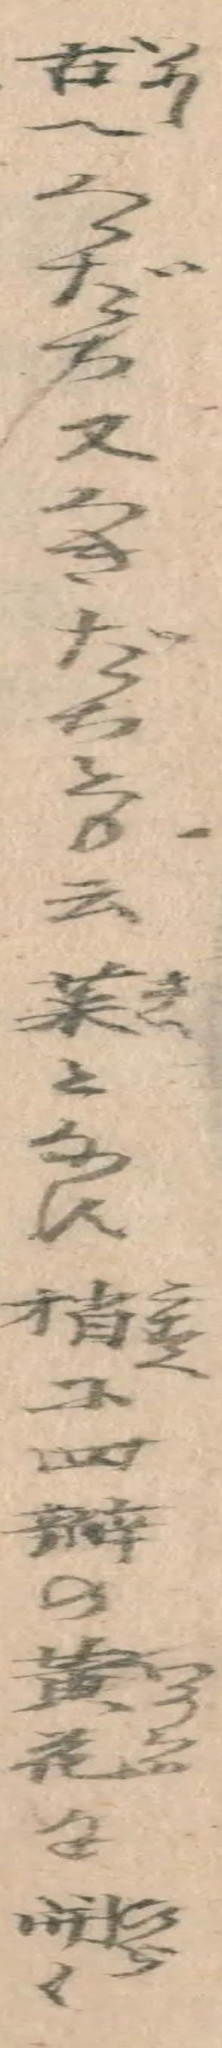古へくゝだち又くきだちとも云菜となす梢に四弁の黄花を開く
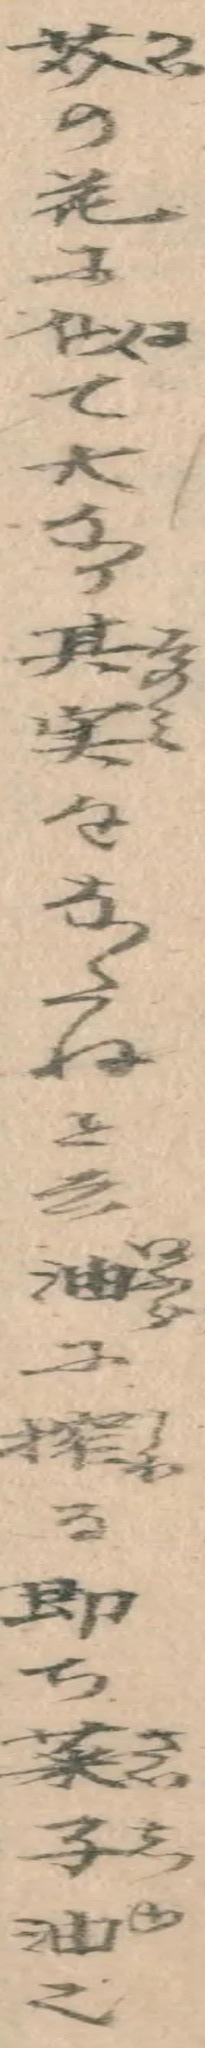芥の花に似て大なり其実をなたねと云油に搾る即ち菜子油也
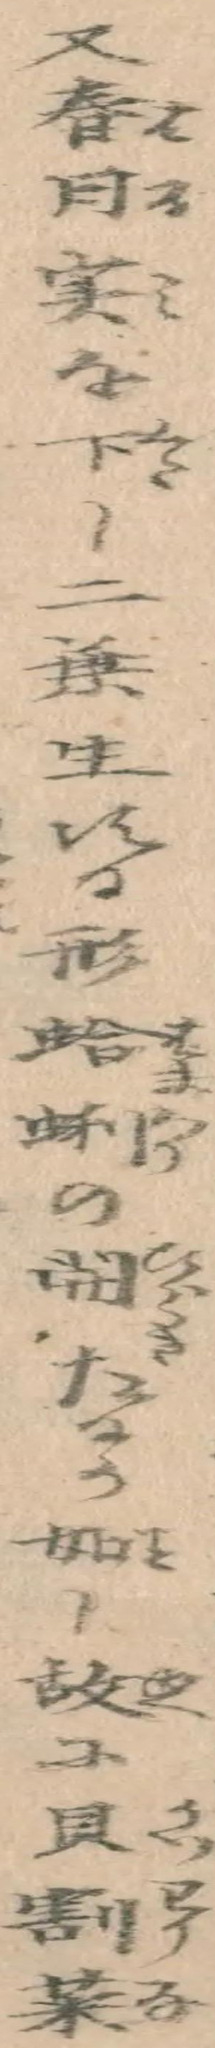又春月実を下し二葉生する形蛤蜊の開たるか如し故に貝割菜
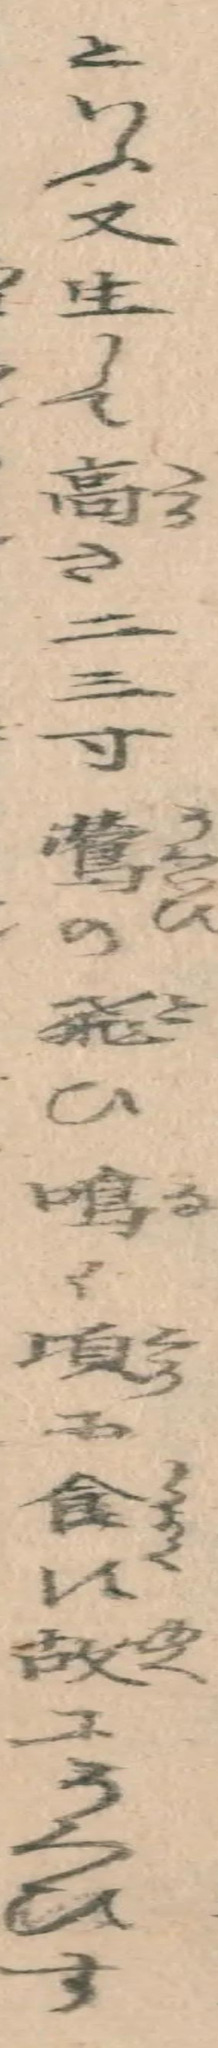といふ又生して高さ二三寸鶯の飛ひ鳴く頃に食す故にうくひす
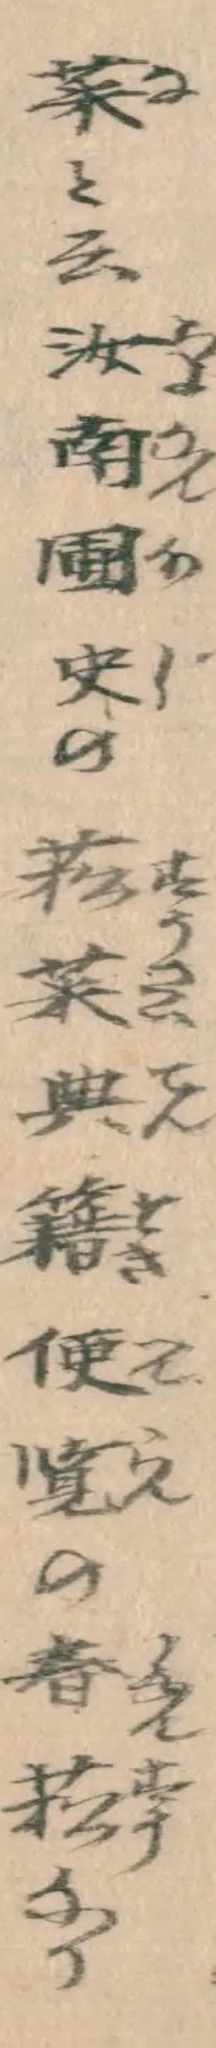菜と云汝南圃史の菘菜典籍便覧の春菘なり

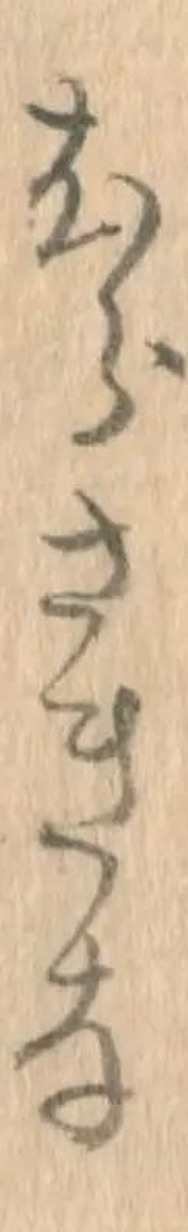むらさきな
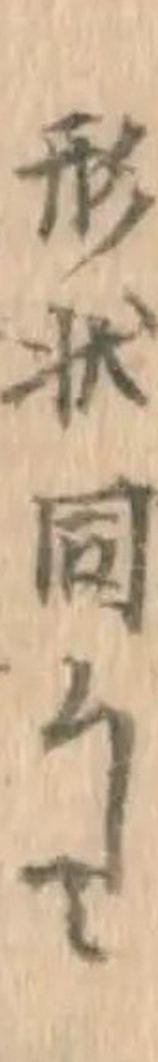形状同くして
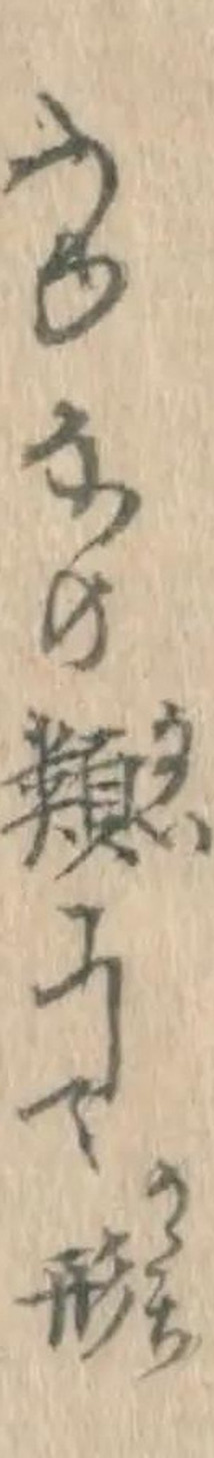ふゆなの類にして形
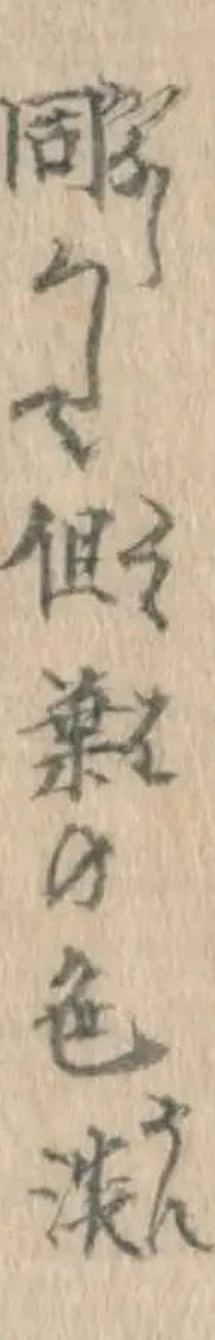同くして但葉の色淡
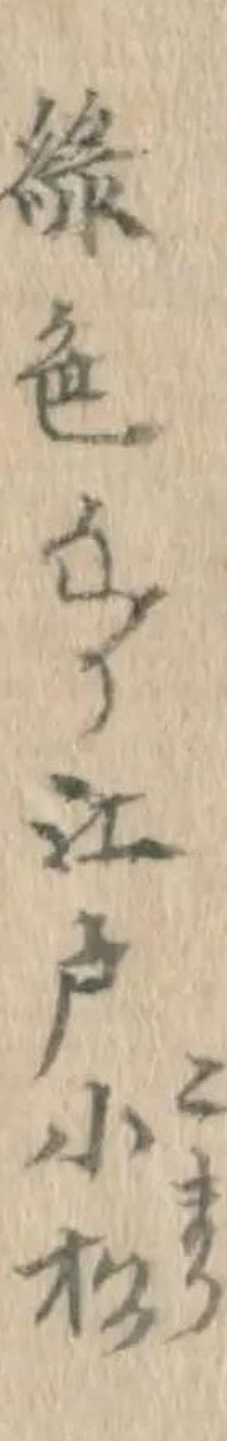緑色なり江戸小松
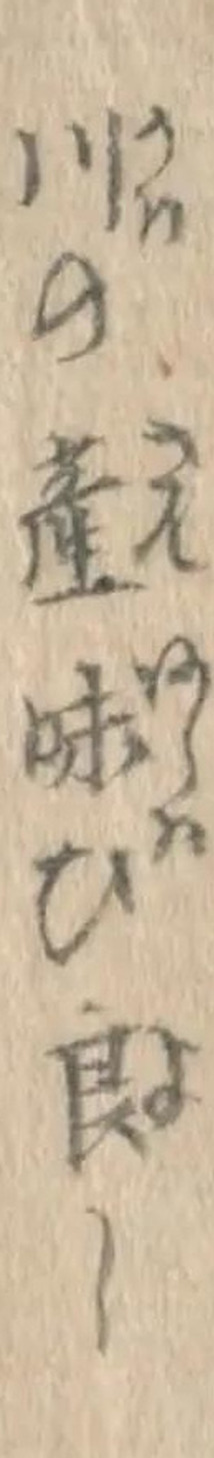川の産味ひ良し

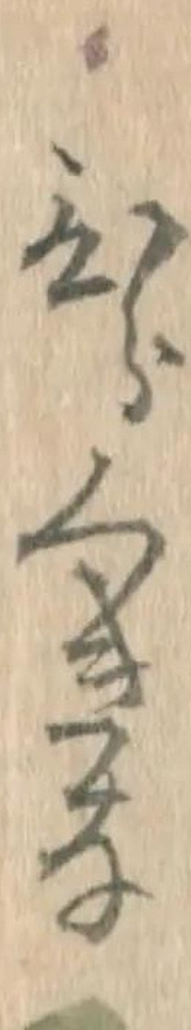ひらくきな

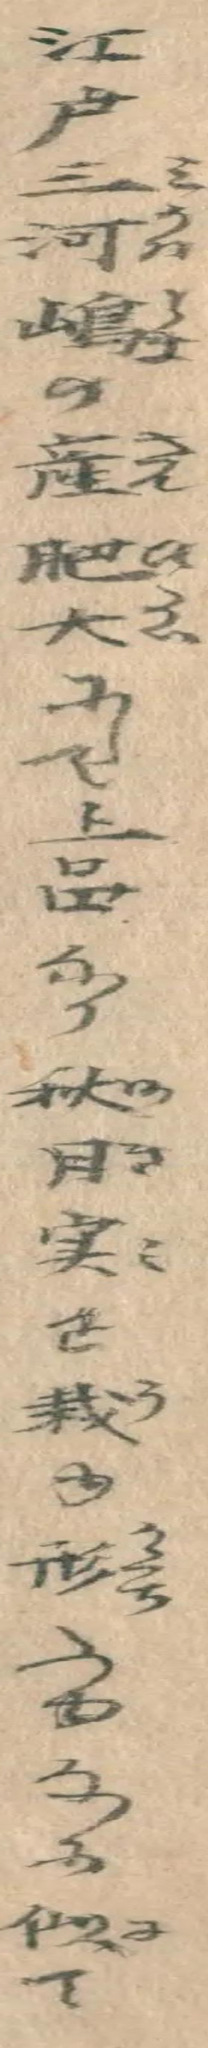江戸三河嶋の産肥大にして上品なり秋月実を栽ゆ形ふゆなに似て
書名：本草図譜. 巻46-48
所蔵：国立国会図書館 National Diet Library, JAPAN
